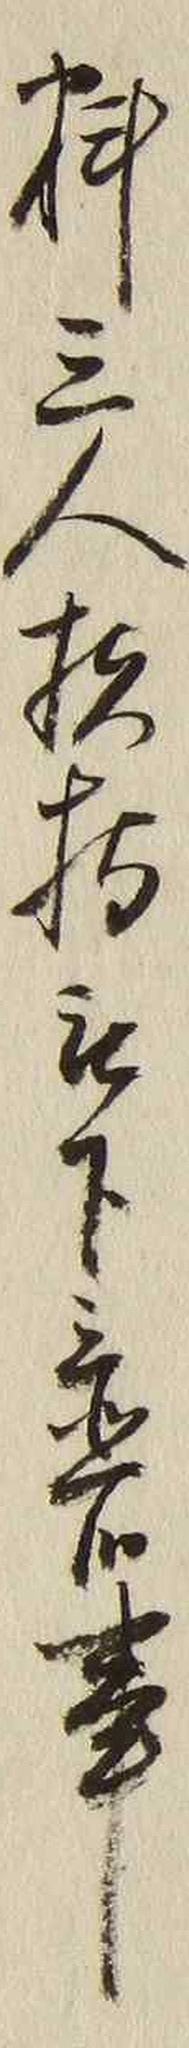料三人扶持被下置候事

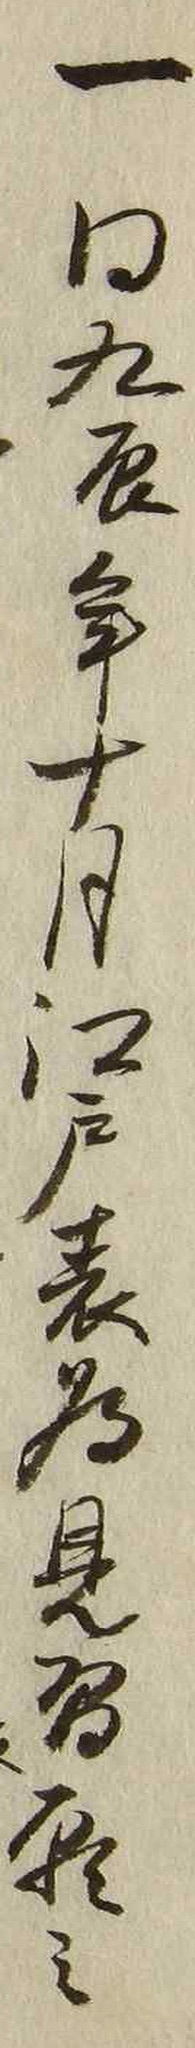一同九辰年十月江戸表為見習願之
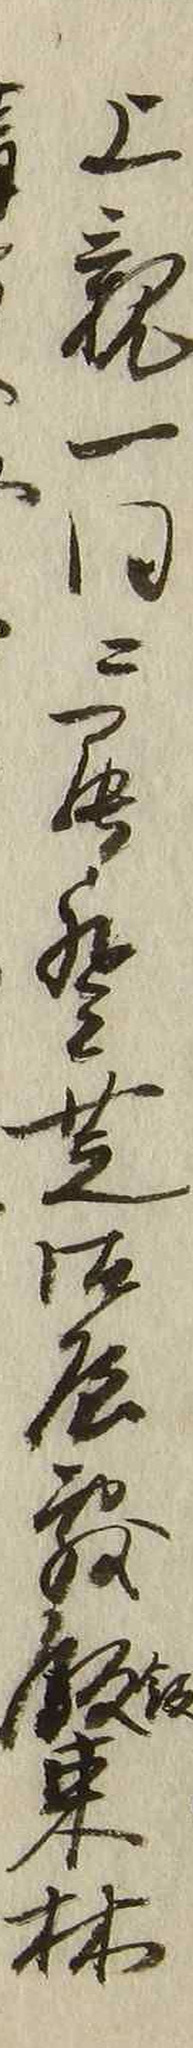上親一同ニ罷登芝御屋敷飯束林
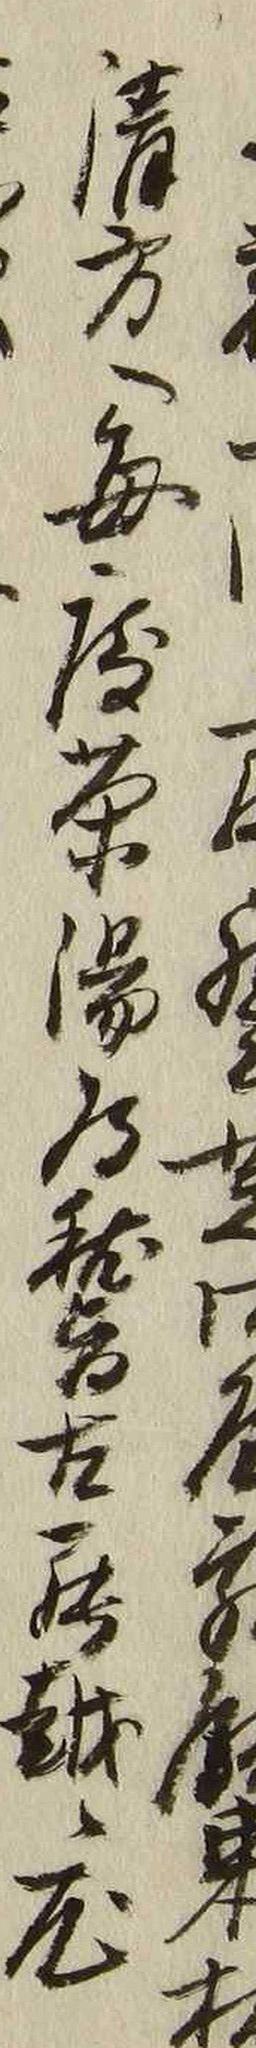清方へ毎度茶湯道稽古罷越候尤
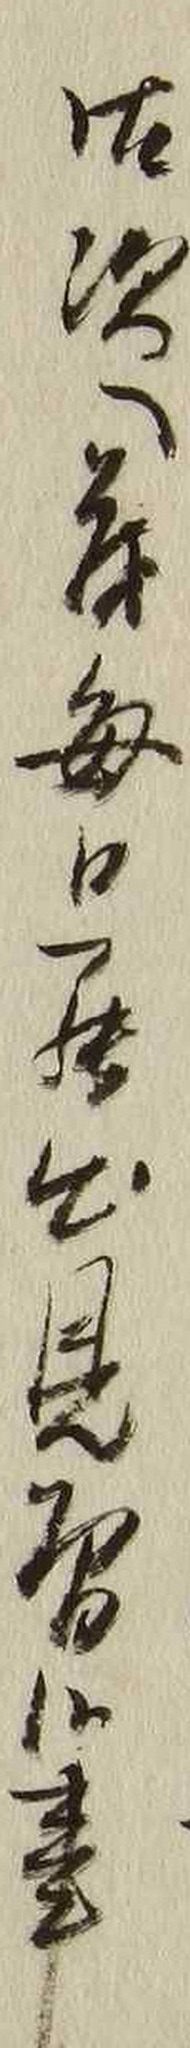御次へ茂毎日罷出見習候事
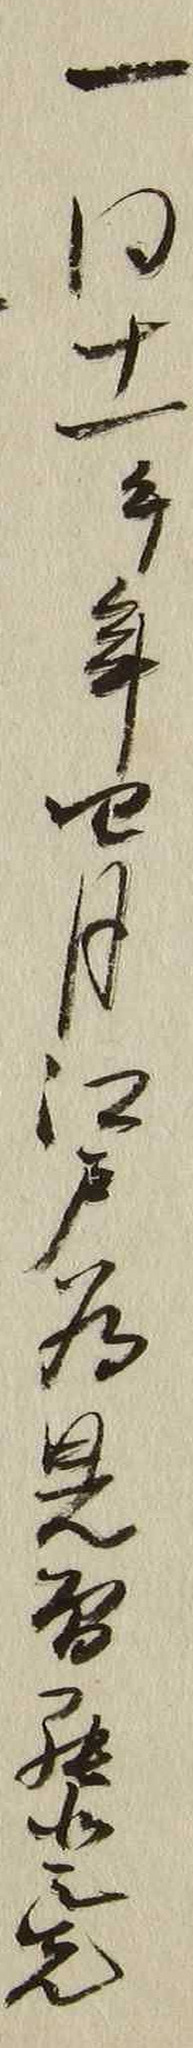一同十一午年四月江戸為見曽罷登先
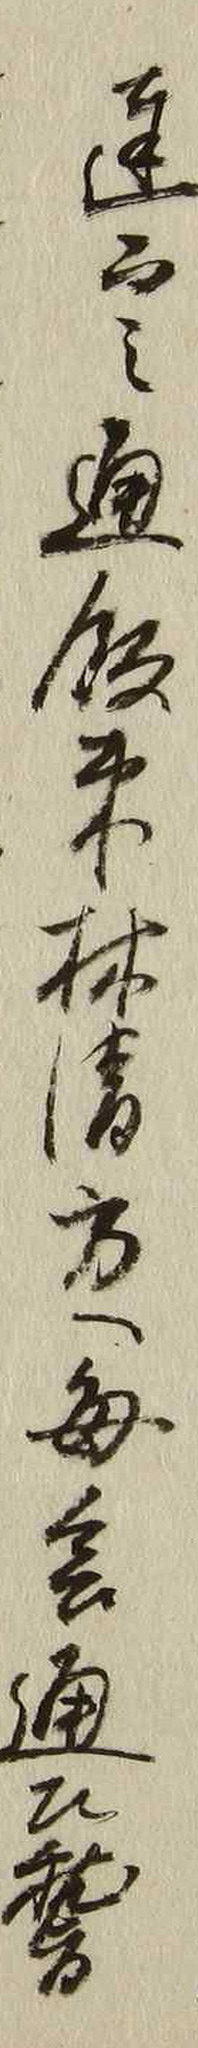達而之通飯束林清方へ毎会通ひ稽
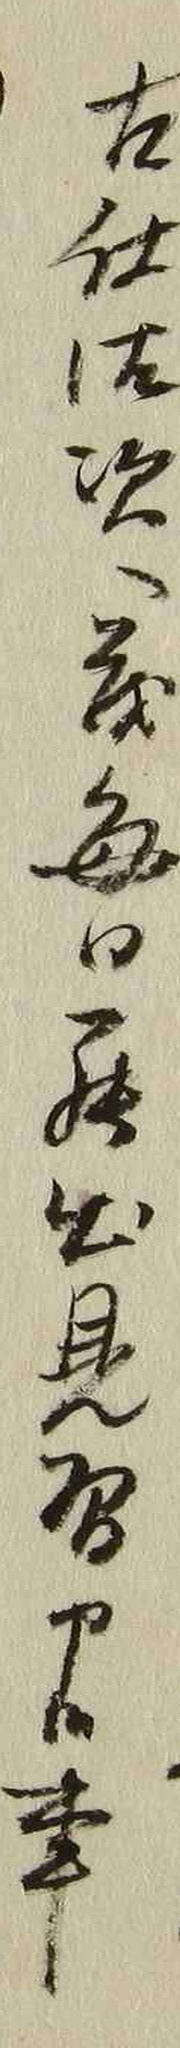古仕御次へ茂毎日罷出見習申候事
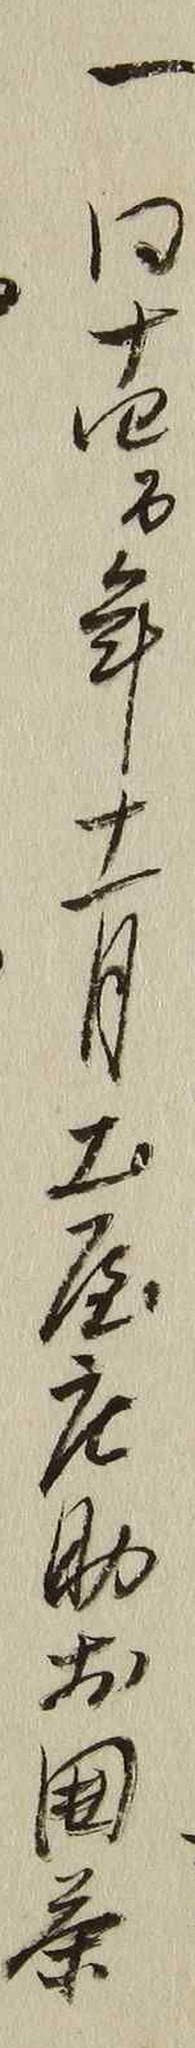一同十四酉年十一月土屋庄助於囲茶
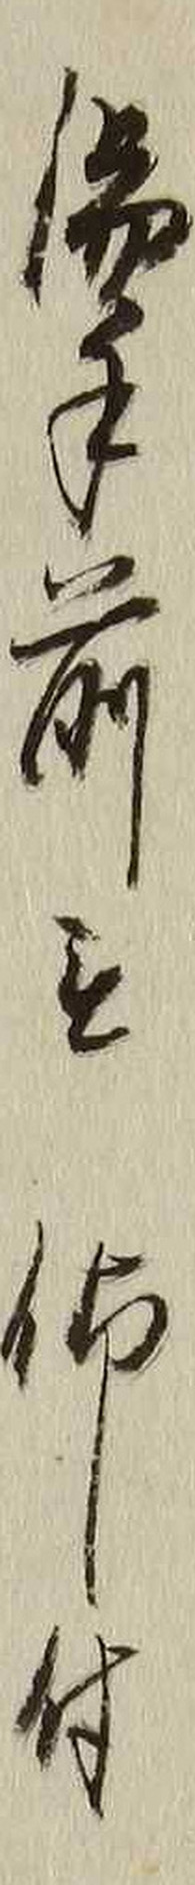湯手前被仰付
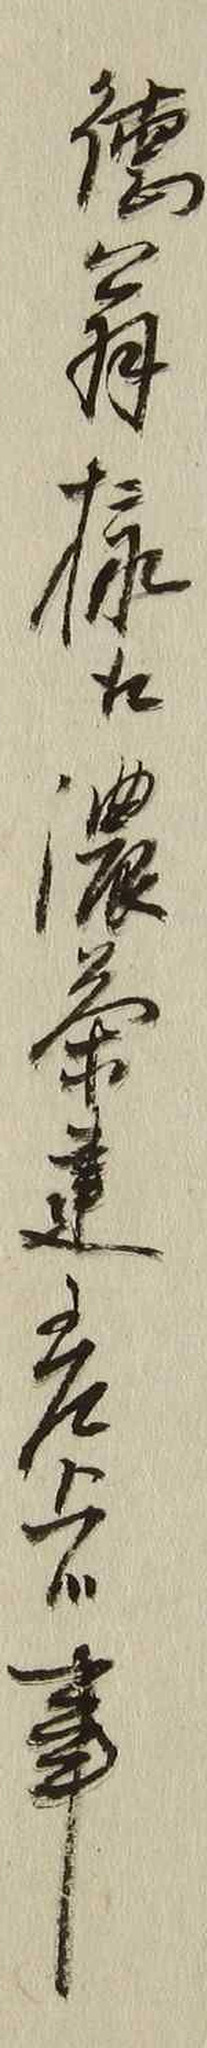徳翁様江濃茶建差上候事
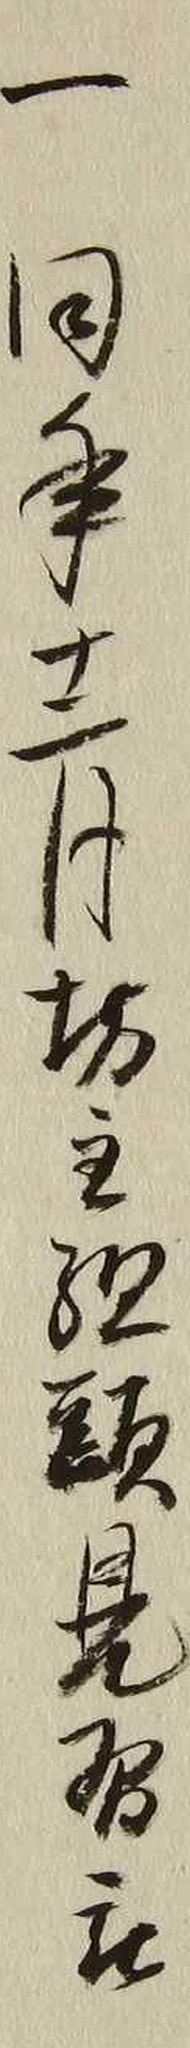一同年十二月坊主組頭見習被
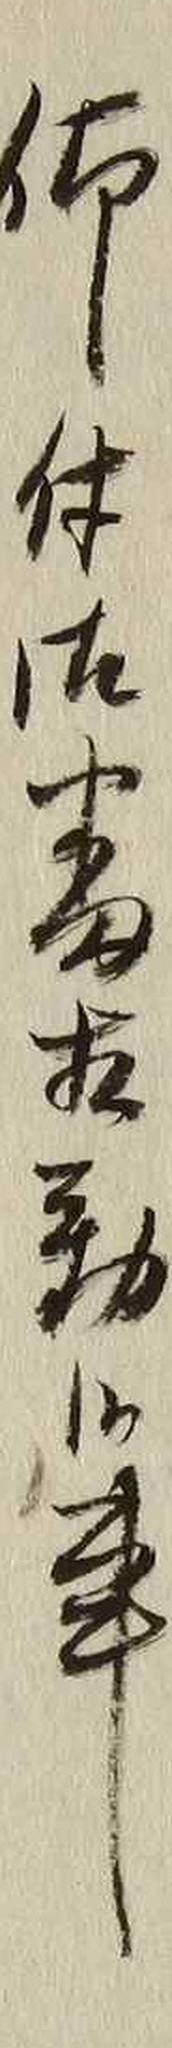仰付御番相勤候事
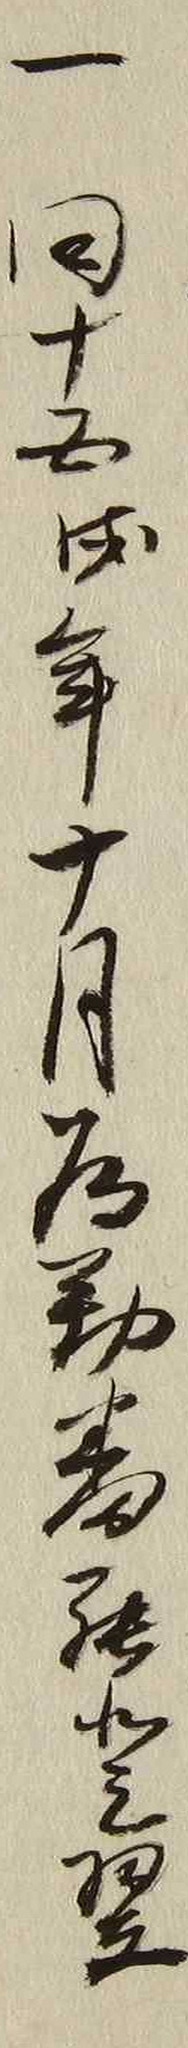一同十五戌年十月為勤番罷登翌
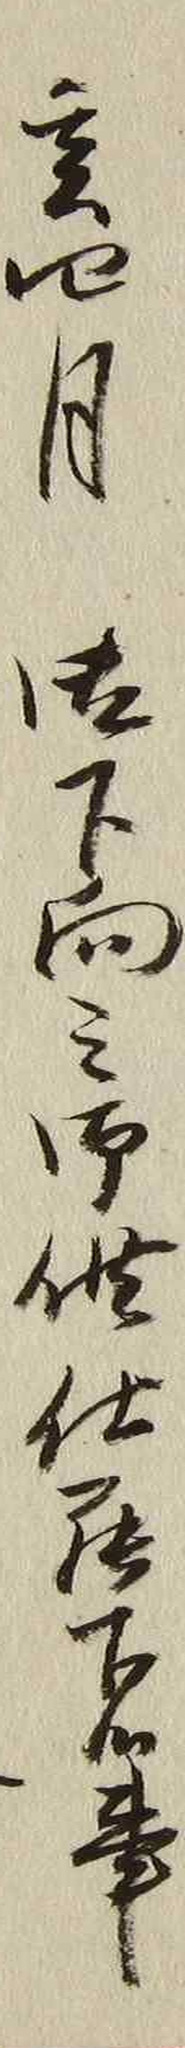亥四月御下向之御供仕罷下候事
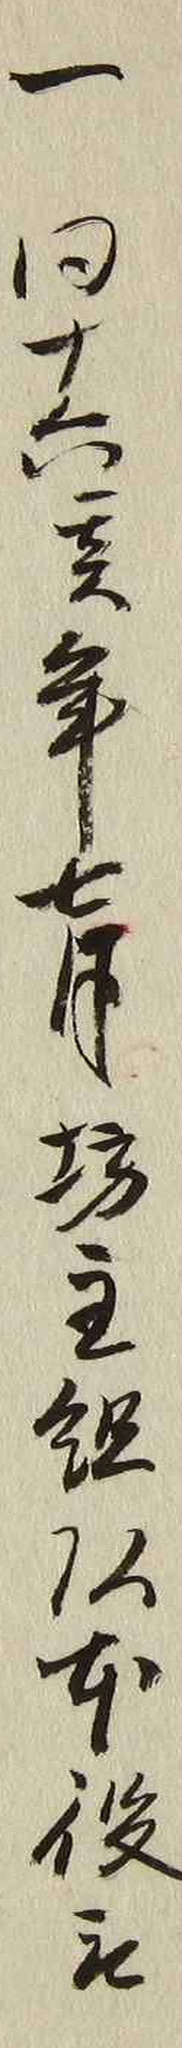一同十六亥年七月坊主組頭本役被
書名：諸士系譜　巻之349　も之部5
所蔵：会津若松市立会津図書館
